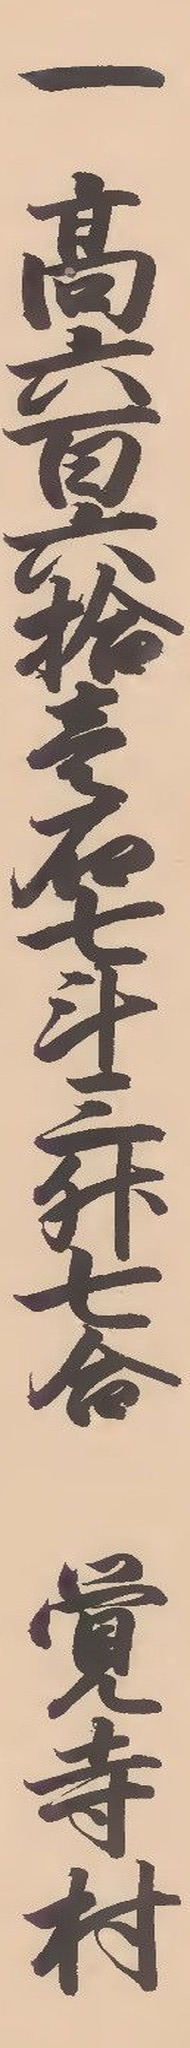一高六百六拾壱石七斗三升七合覚寺村

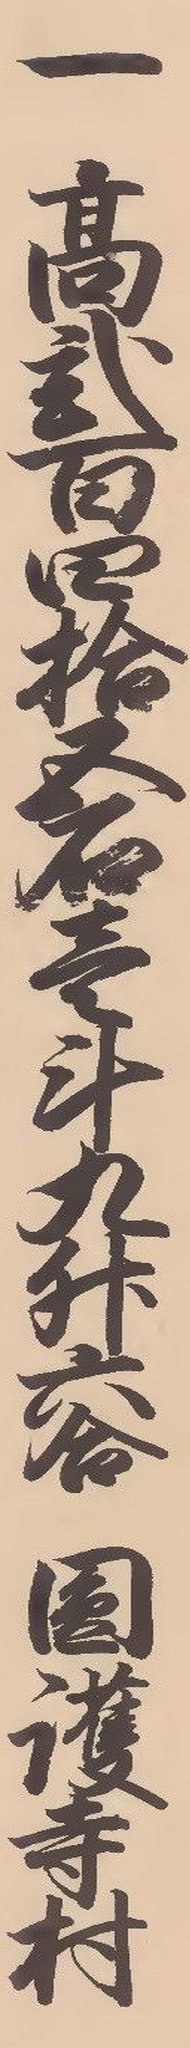一高弐百四拾五石壱斗九升六合円護寺村
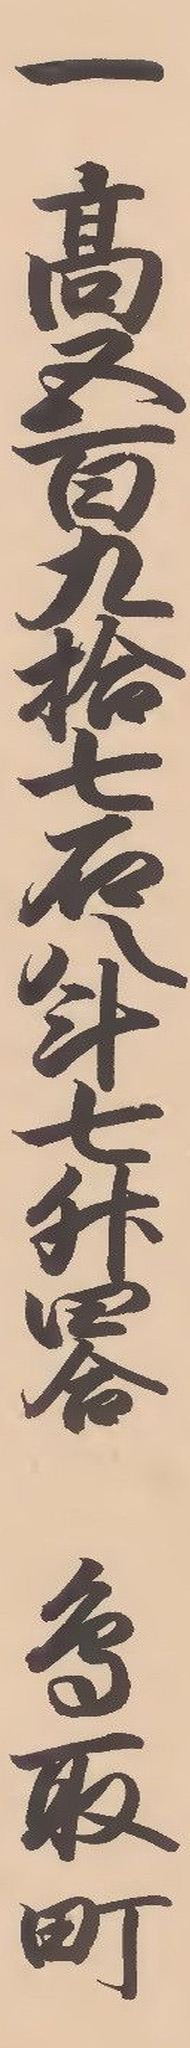一高五百九拾七石八斗七升四合鳥取町
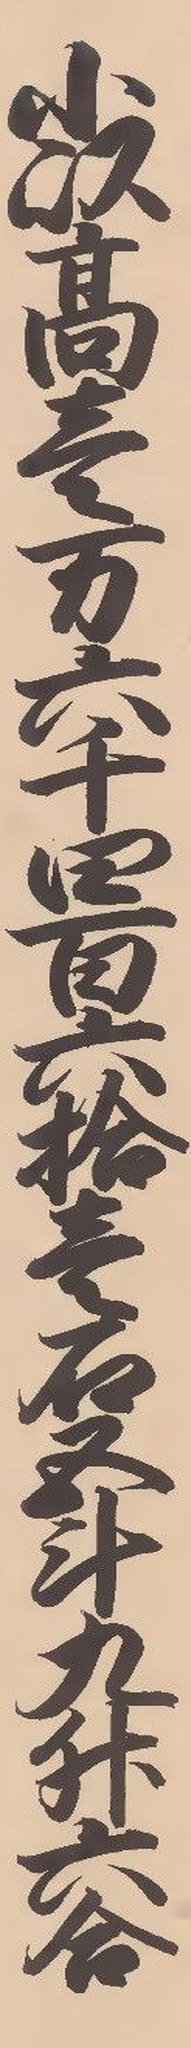小以高壱万六千四百六拾壱石五斗九升六合

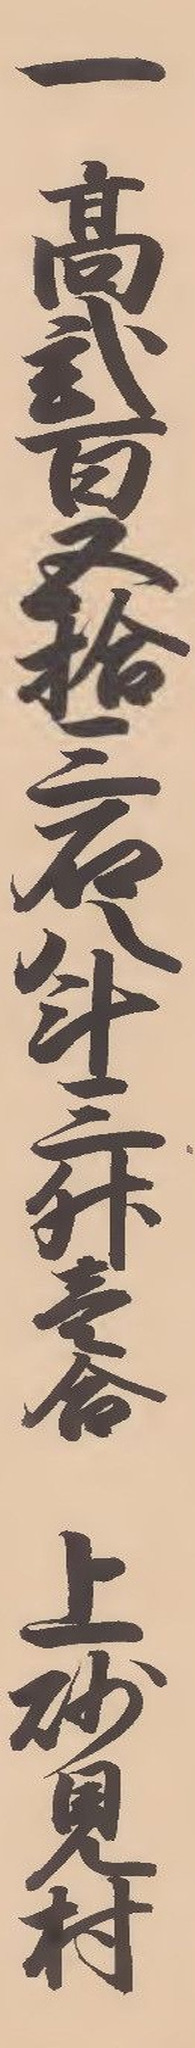一高弐百五拾三石八斗三升壱合上砂見村
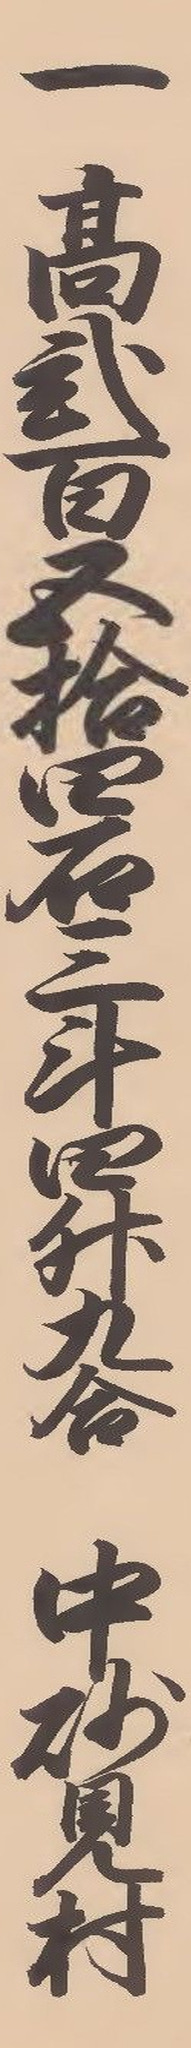一高弐百五拾四石三斗四升九合中砂見村
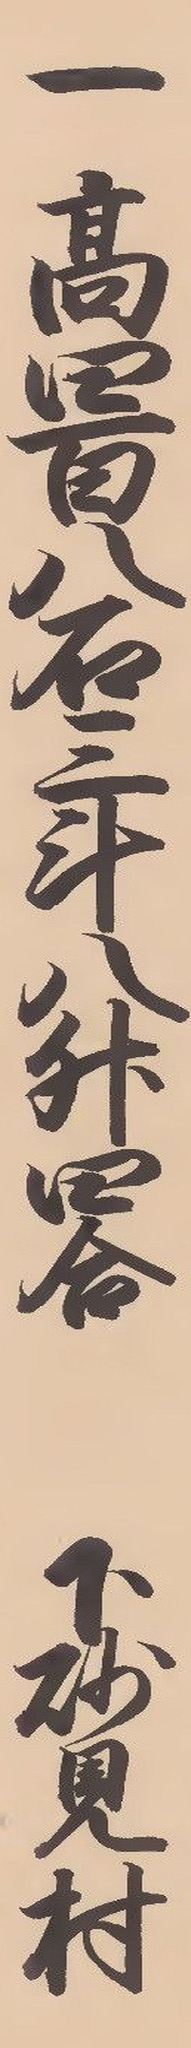一高四百八石三斗八升四合下砂見村
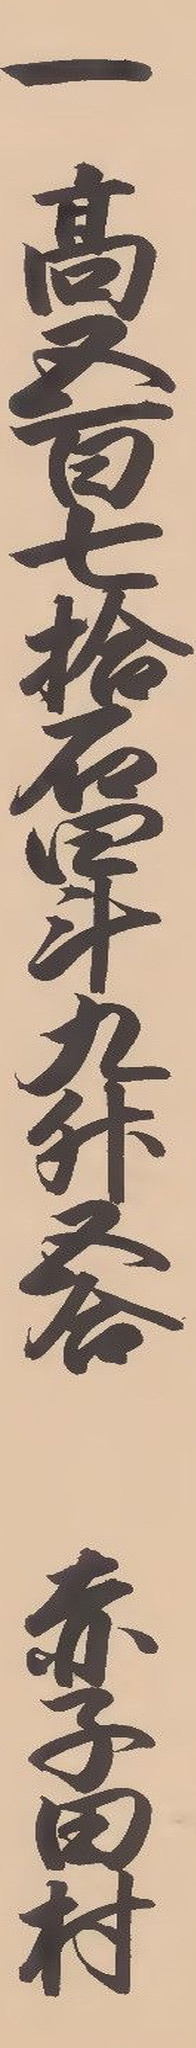一高五百七拾石四斗九升五合赤子田村
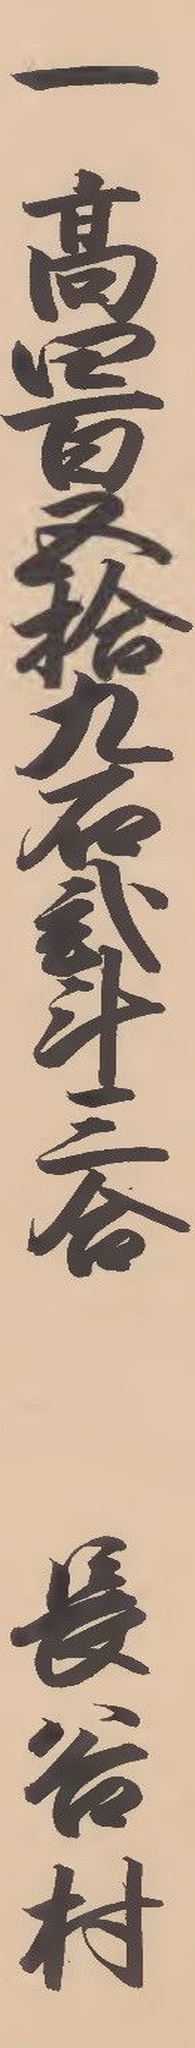一高四百五拾九石弐斗三合長谷村
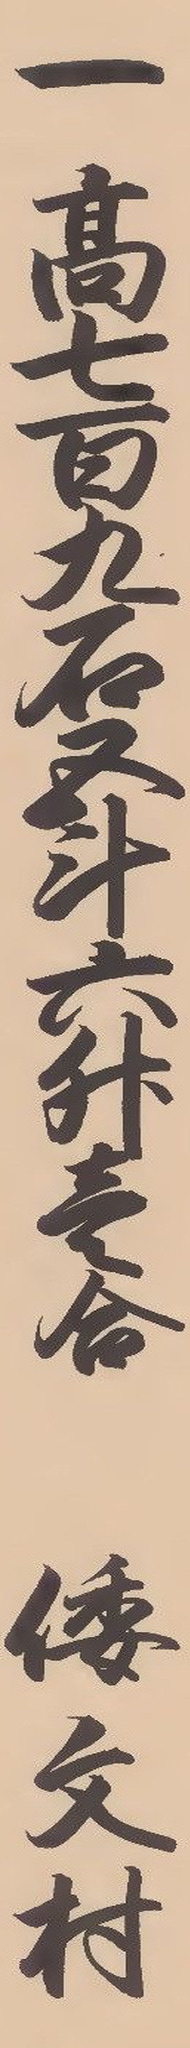一高七百九石五斗六升壱合倭文村
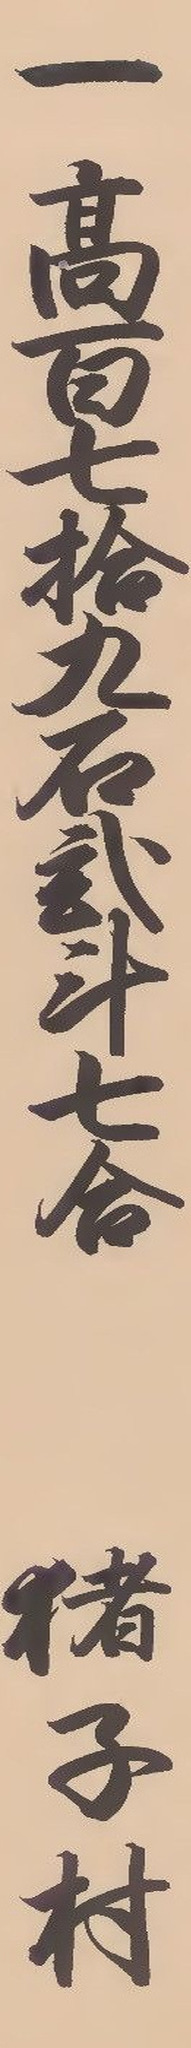一高百七拾九石弐斗七合猪子村

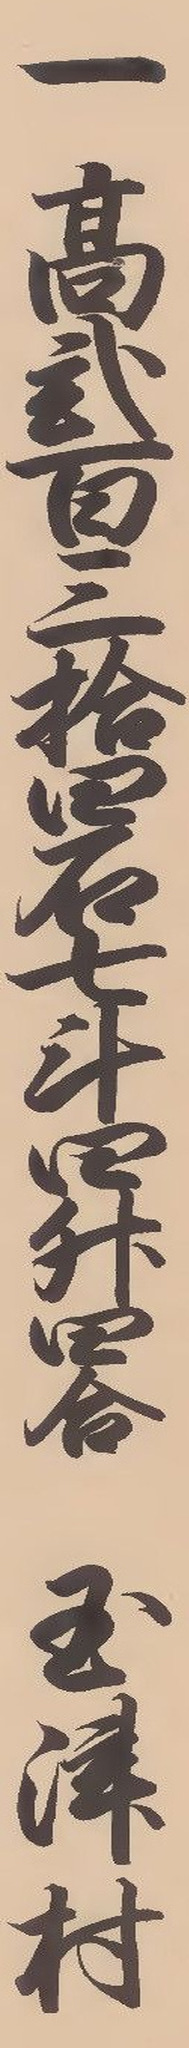一高弐百三拾四石七斗四升四合玉津村
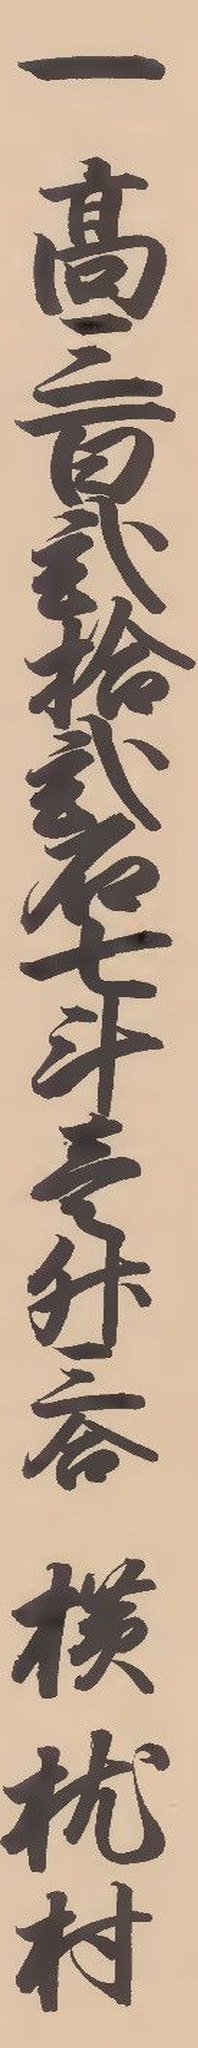一高三百弐拾弐石七斗壱升三合横枕村
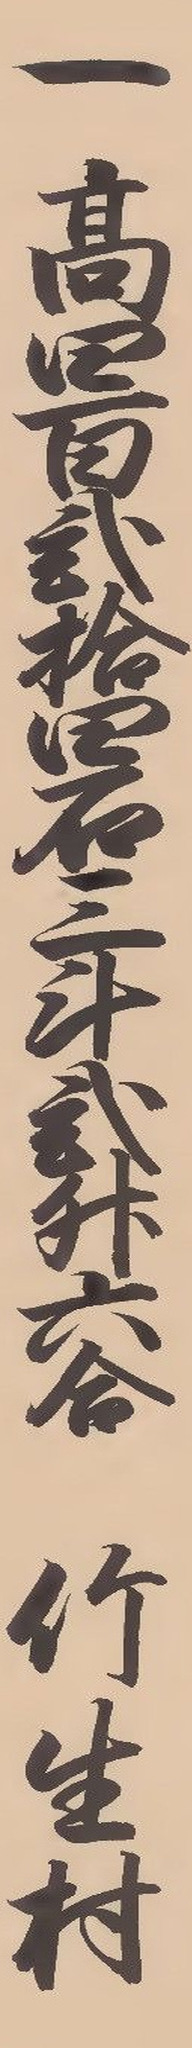一高四百弐拾四石三斗弐升六合竹生村
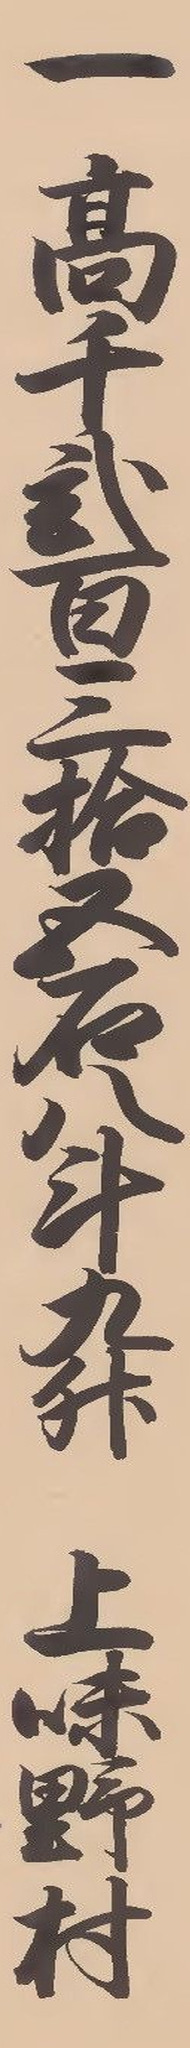一高千弐百三拾五石八斗九升上味野村
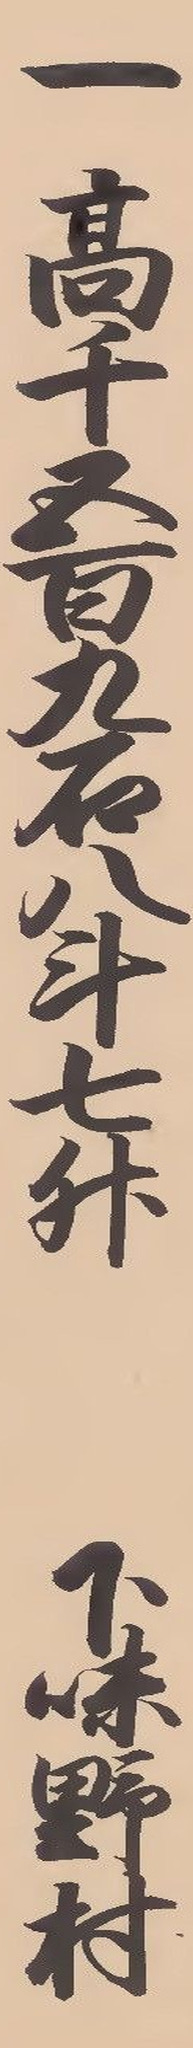一高千五百九石八斗七升下味野村
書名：因幡国郷帳
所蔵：国立公文書館 National Archives of Japan
